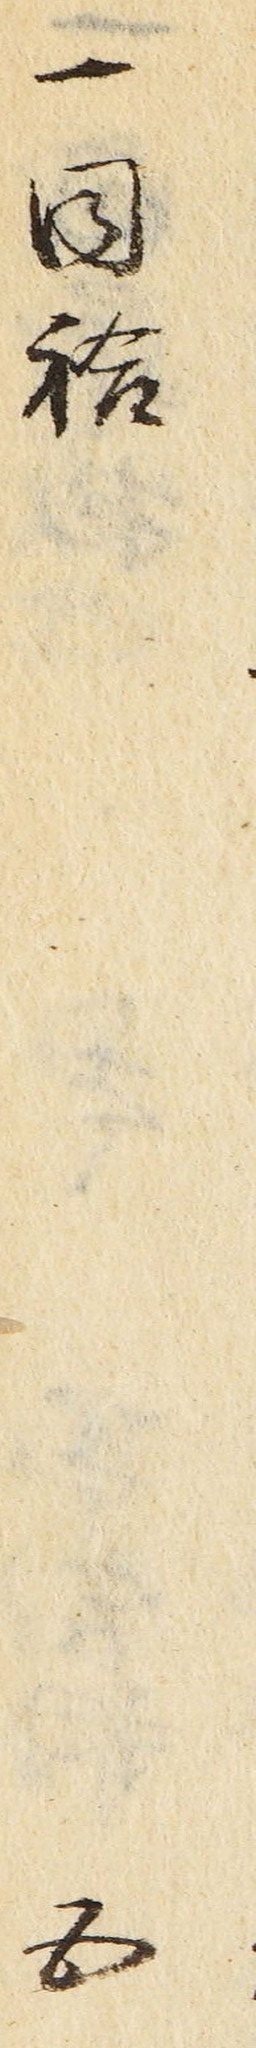一同袷五

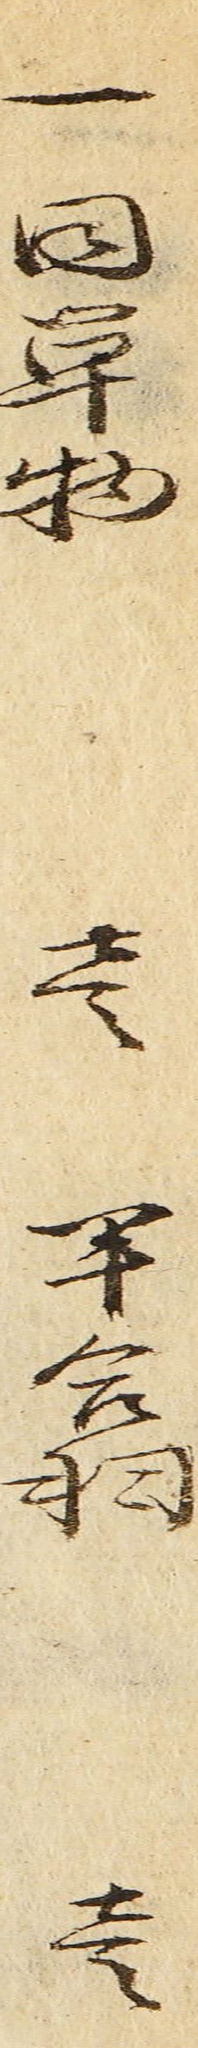一同単物壱半合羽壱
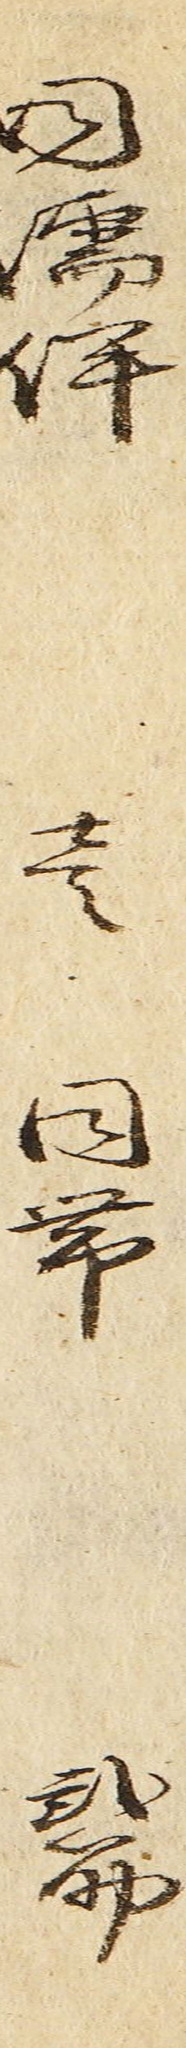同襦袢壱同帯弐筋
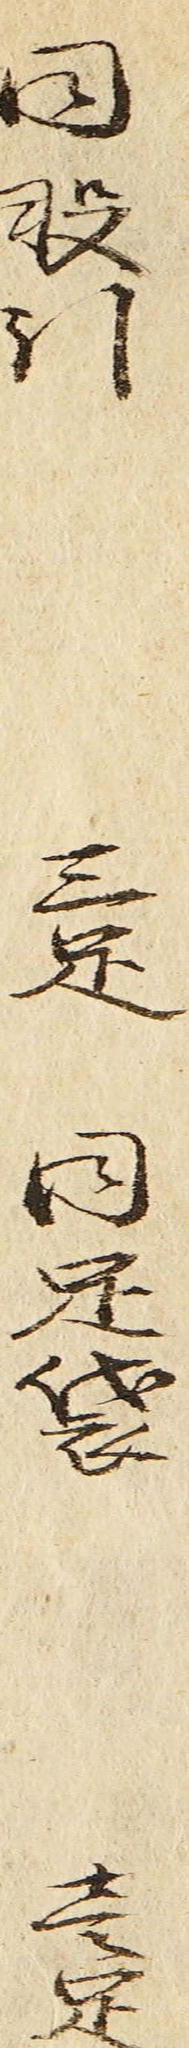同股引三足同足袋壱足
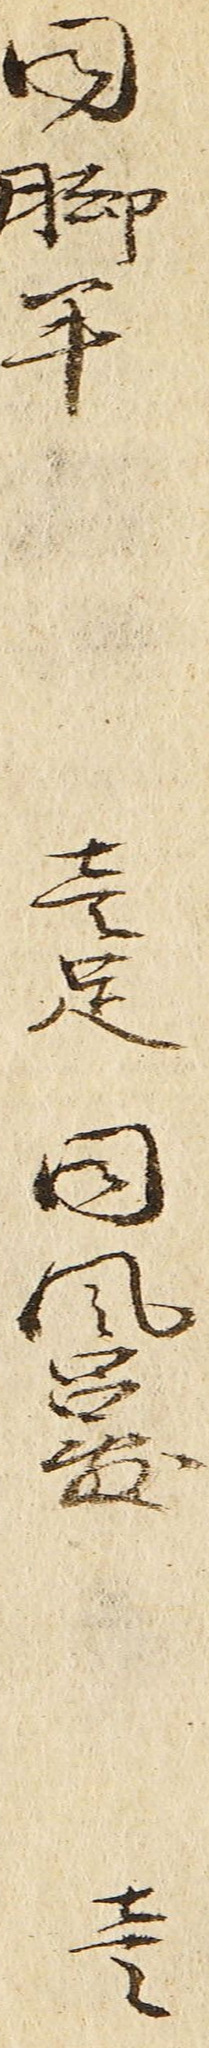同脚半壱足同風呂敷壱
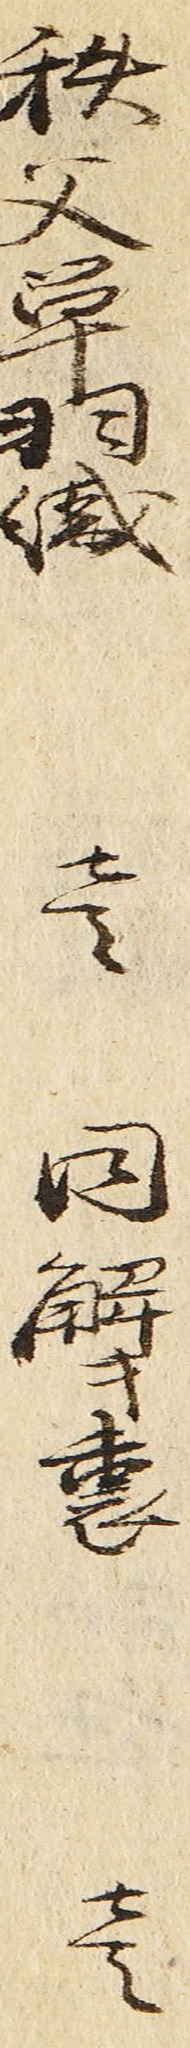秩父単羽織壱同解キ裏壱
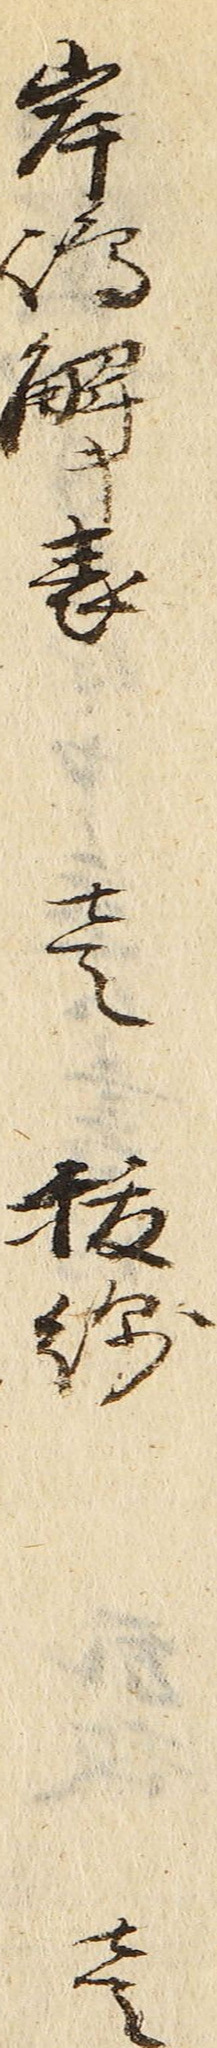岸島解キ表壱抜綿壱
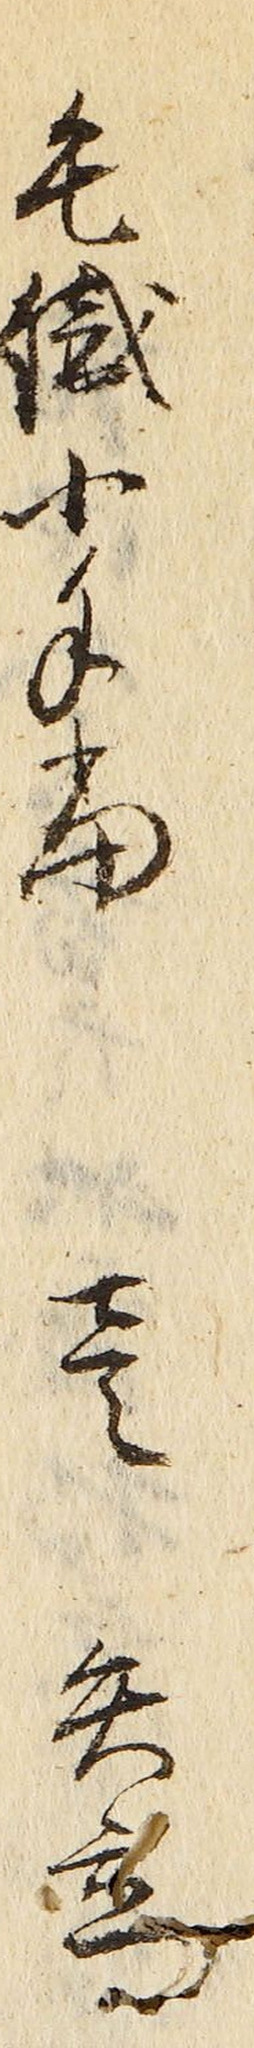毛織小手当壱矢立壱本
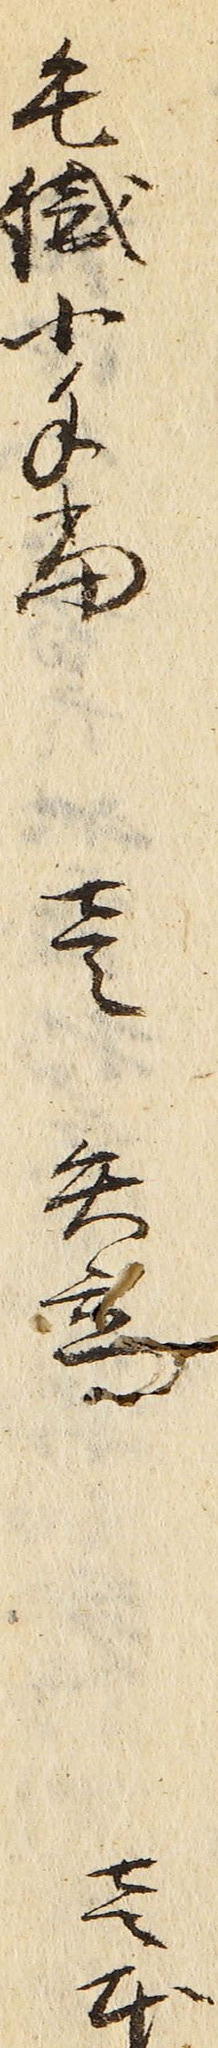毛織小手当壱矢立壱本
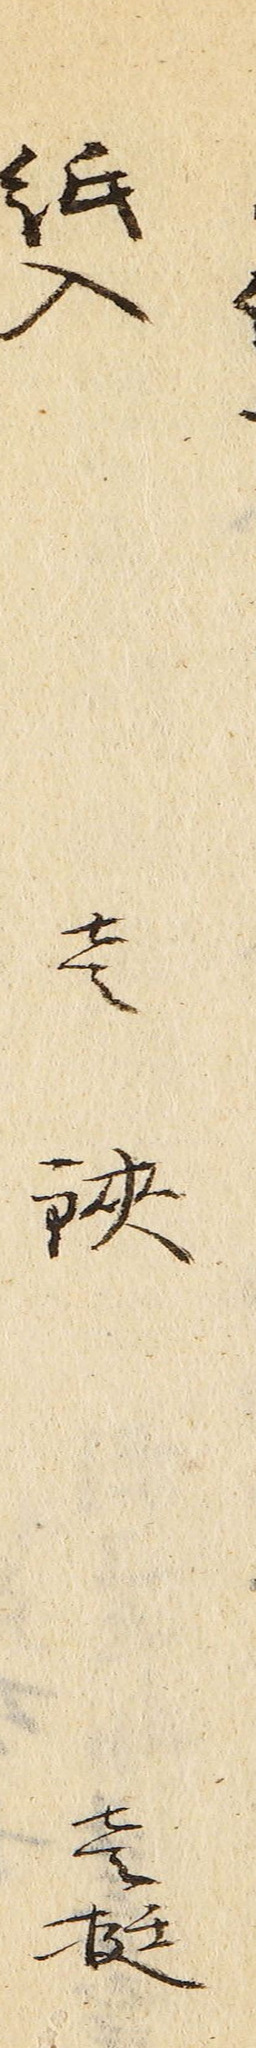紙入壱鋏壱挺
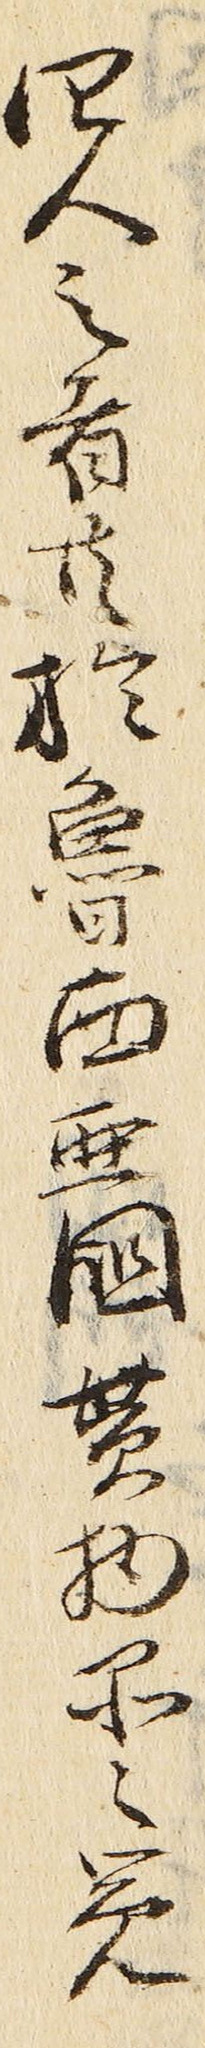四人之者共於魯西亜国貰物品々覚
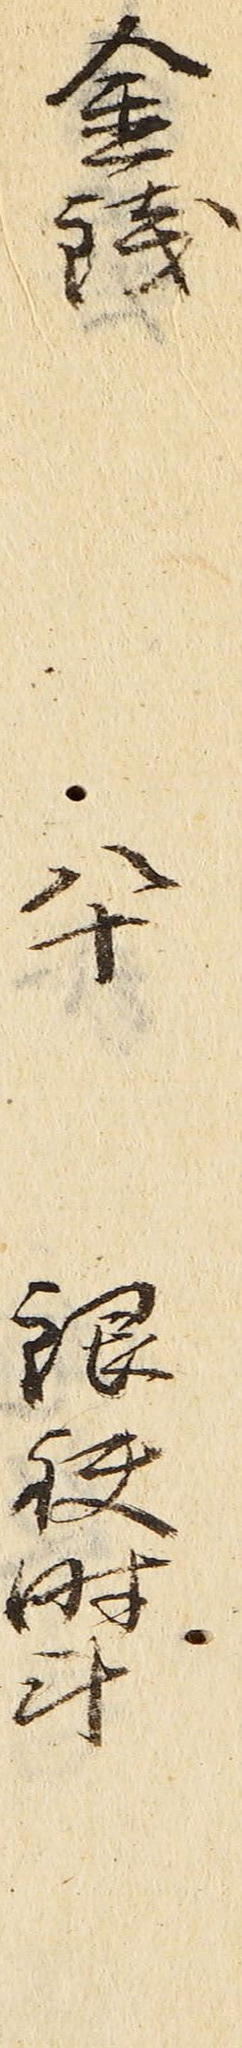金銭八十銀袂時計四
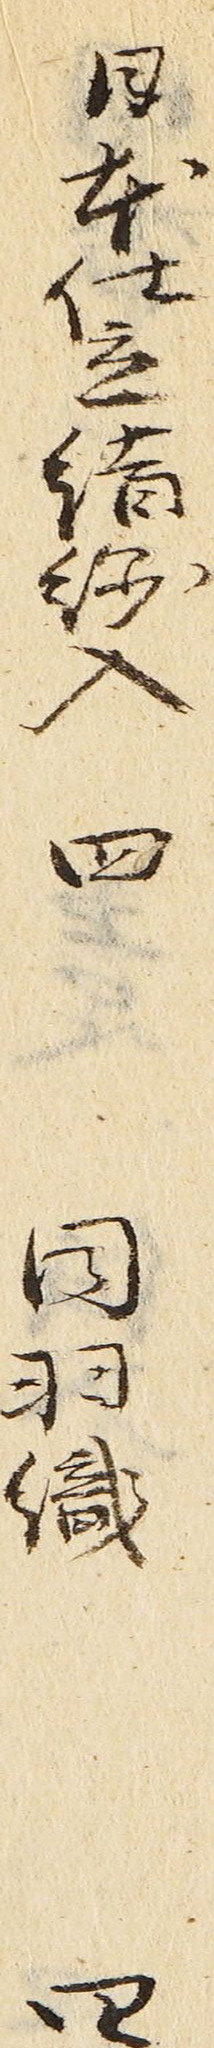日本仕立絹綿入四同羽織四
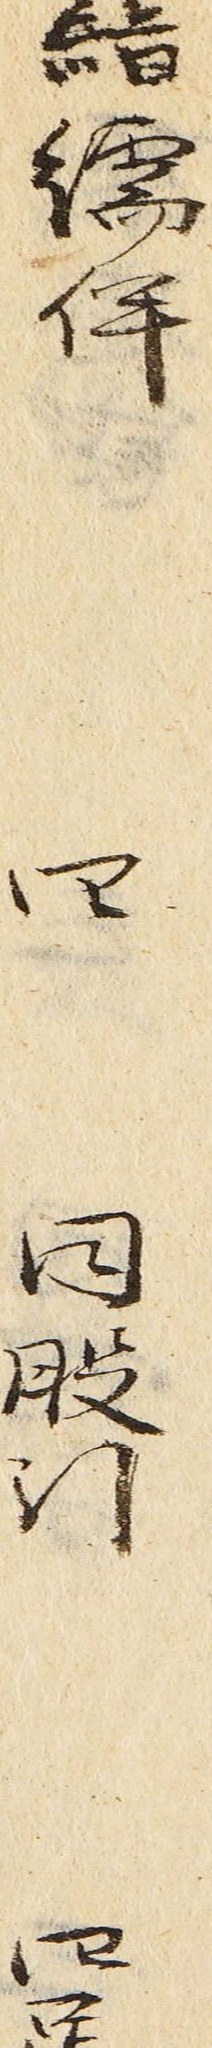絹襦袢四同股引四足
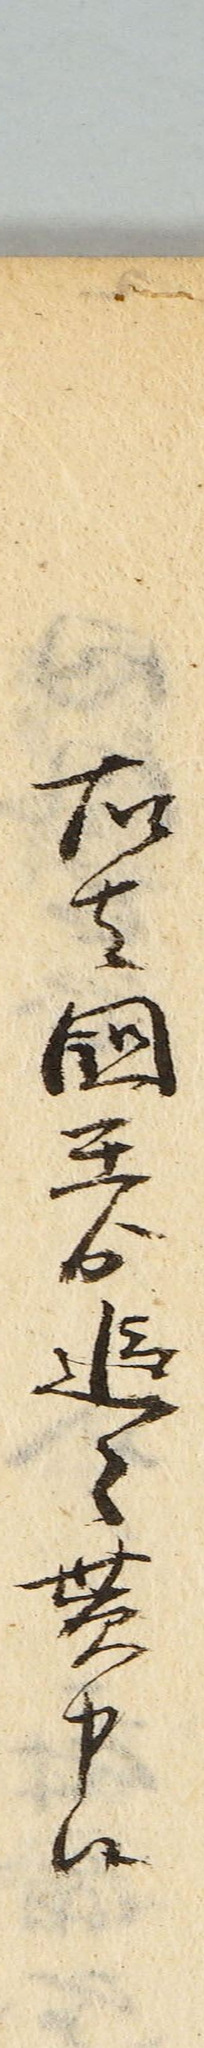右は国王ゟ追々貰申候
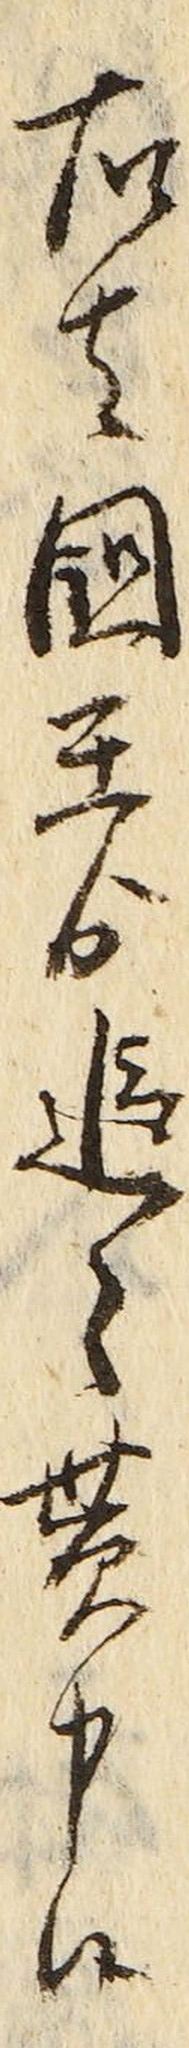右は国王ゟ追々貰申候
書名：漂民後記
